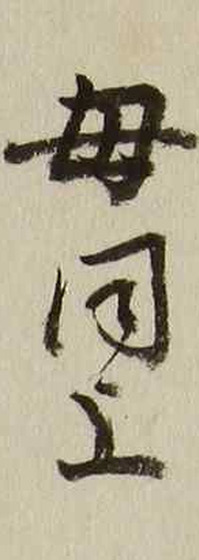母同上
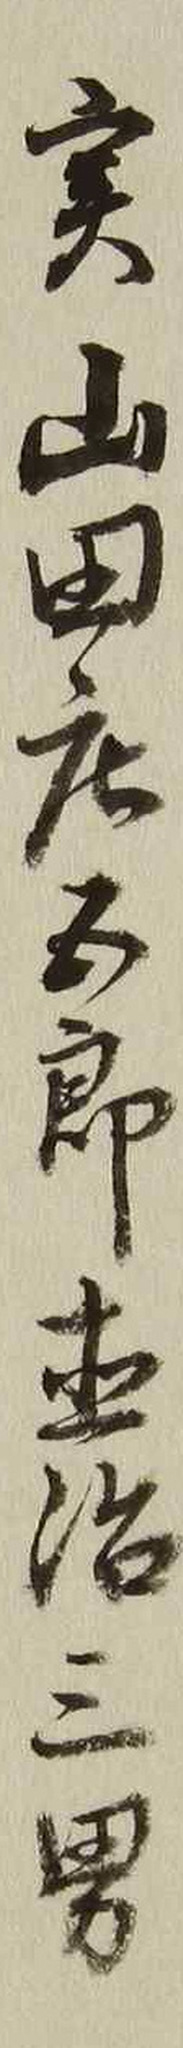実山田庄五郎直治三男
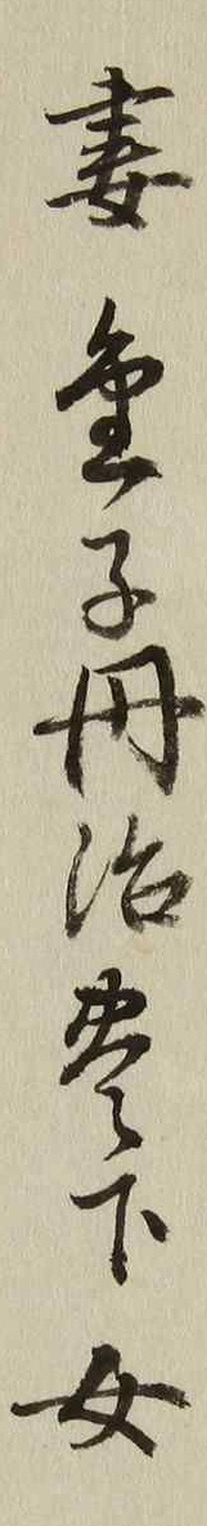妻金子丹治豊下女
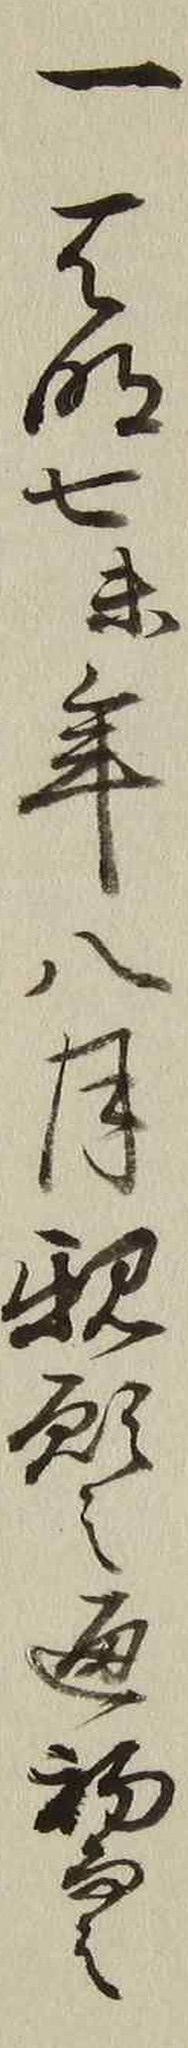一天明七未年八月親願之通初而之
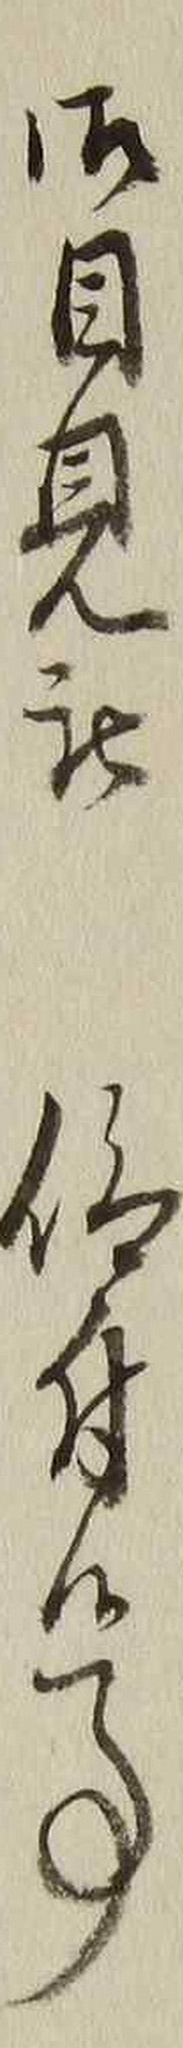御目見被仰付候事
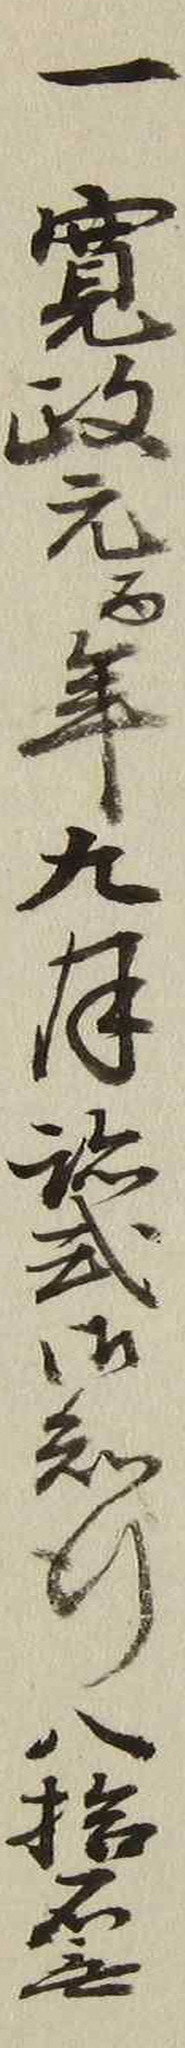一寛政元酉年九月跡式御知行八拾石無
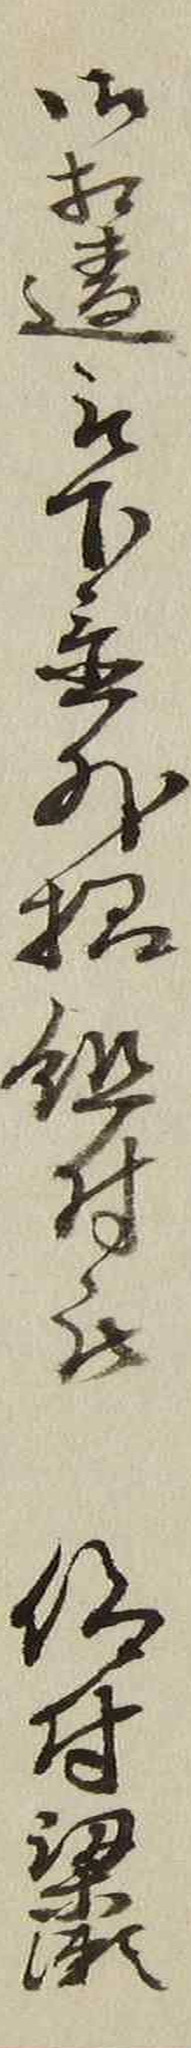御相違被下置外根組付被仰付梁瀬
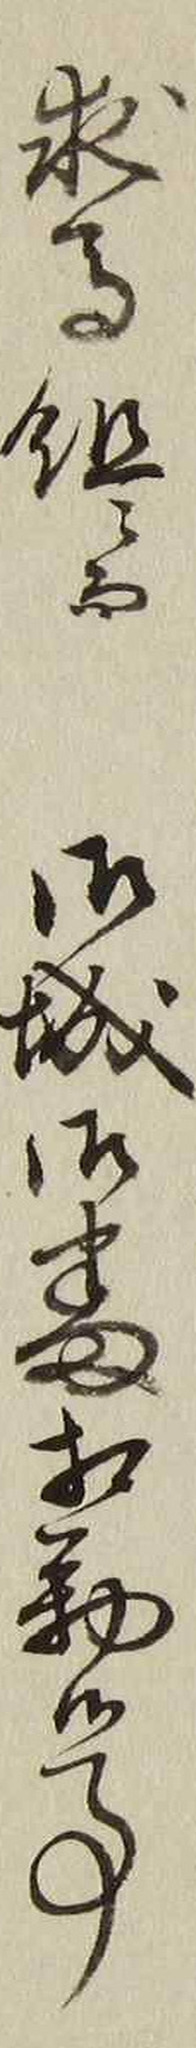求馬組ニ而御城御番相勤候事
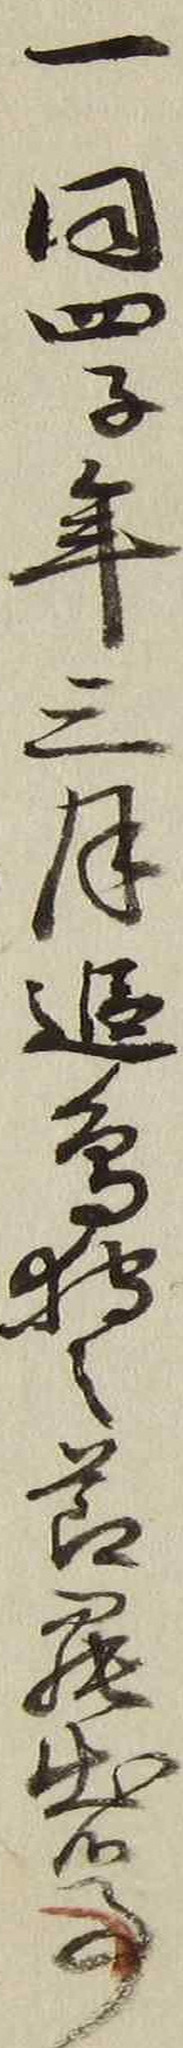一同四子年三月追鳥持之節罷出候事
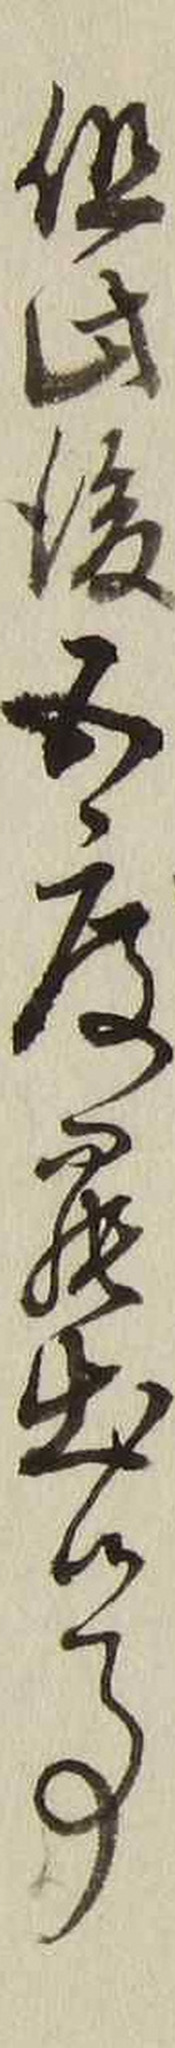但此後五度罷出候事
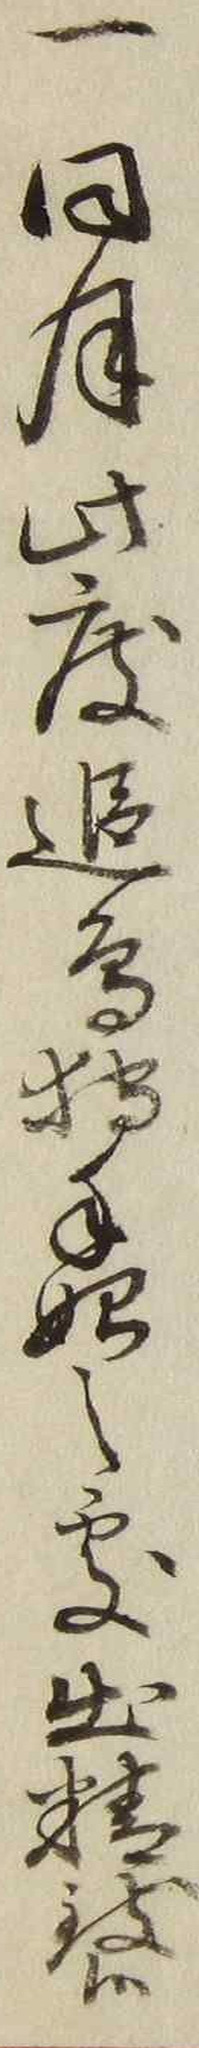一同月此度追鳥転手始之処出精致候

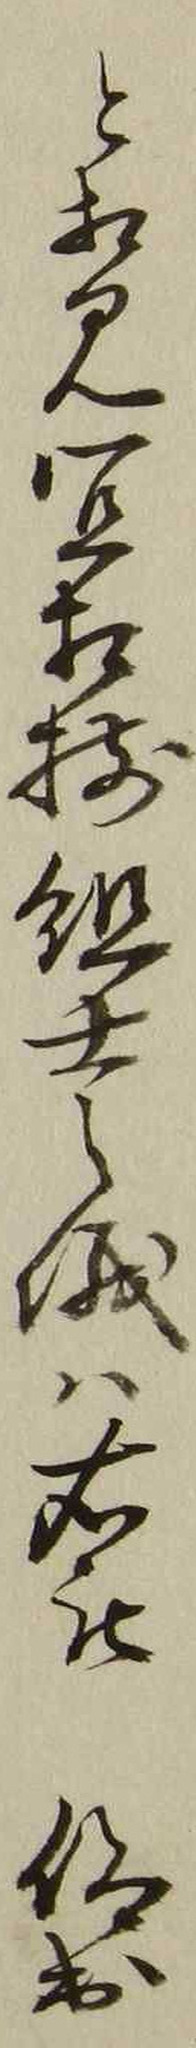と相見宜相揃組士之儀ハ右被仰出
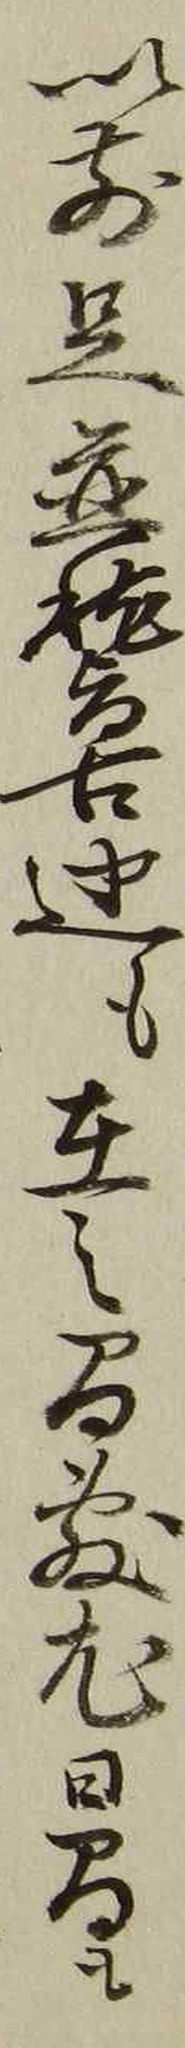以前足並稽古迚も在之間敷尤日間も
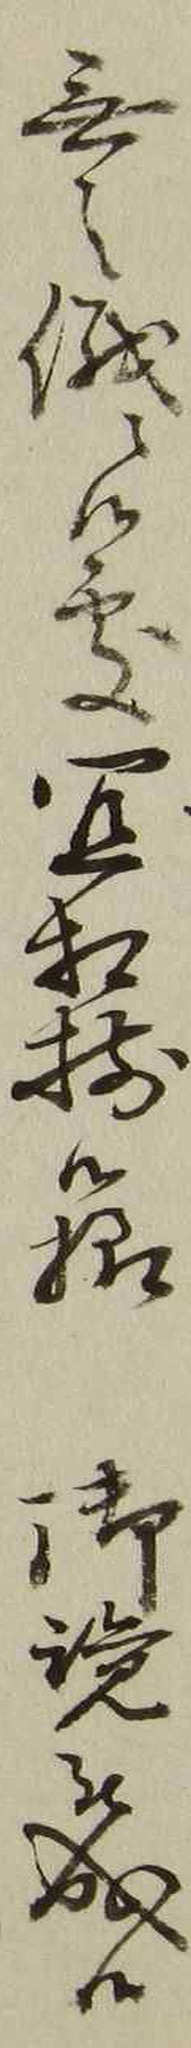無之儀ニ候処宜相揃候様御覧被成候
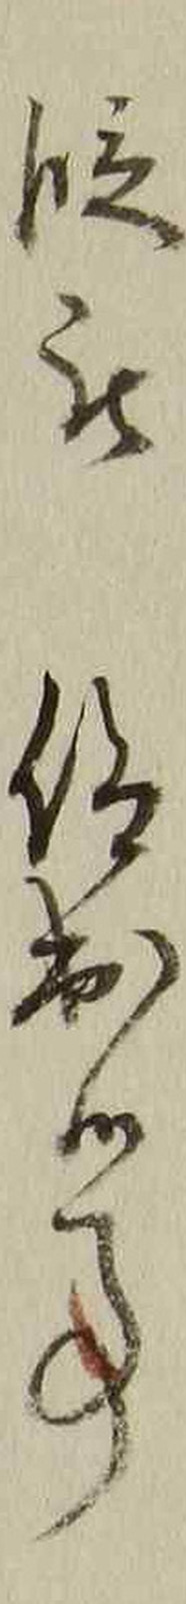段被仰出候事
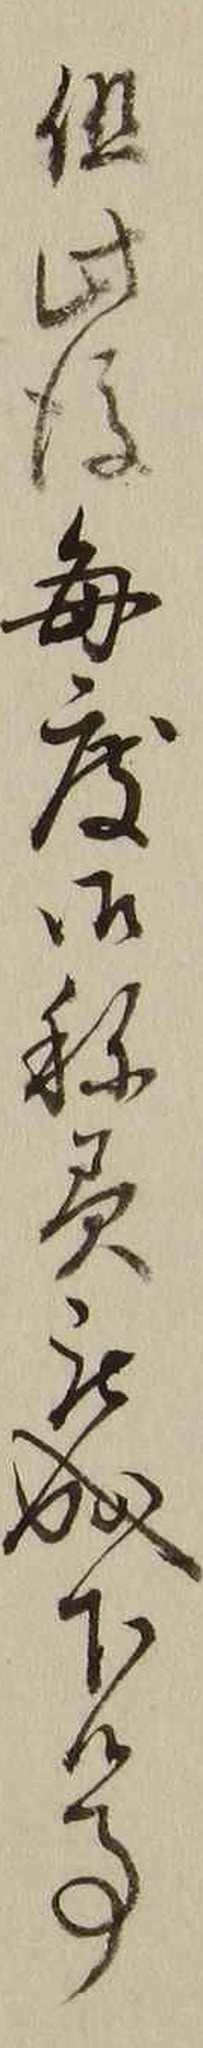但此後毎度御称美被成下候事
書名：諸士系譜　巻之35　は之部3
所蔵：会津若松市立会津図書館
